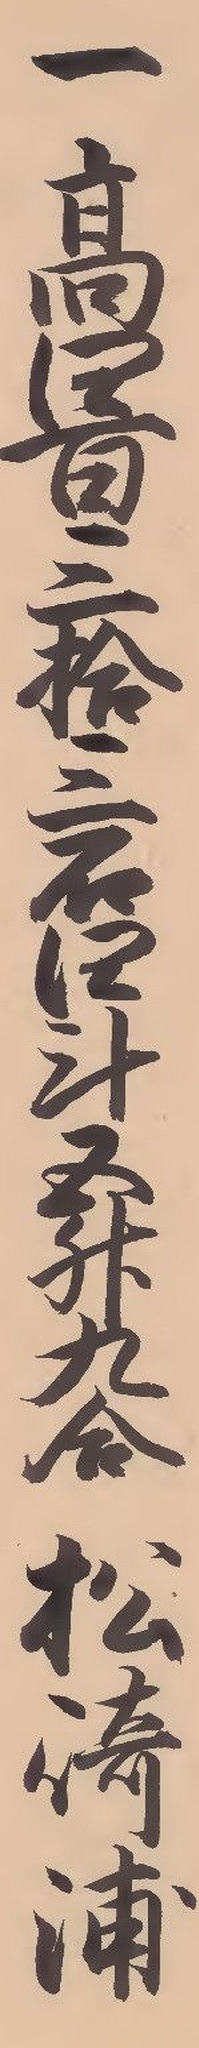一高四百三拾三石四斗五升九合松崎浦
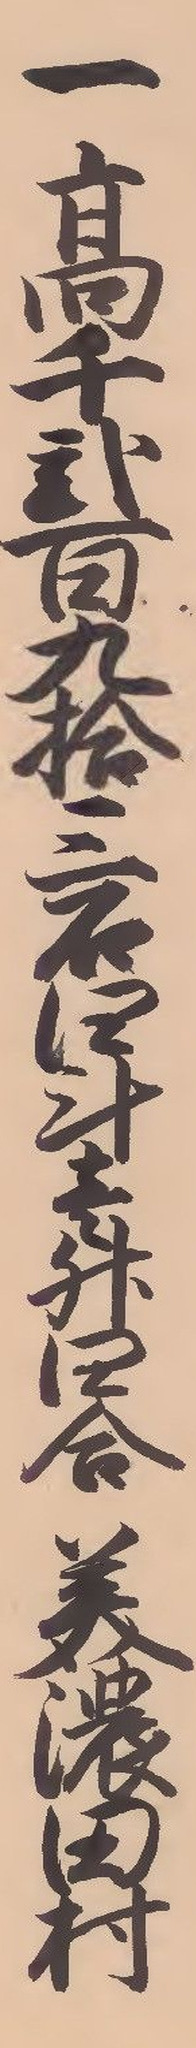一高千弐百九拾三石四斗壱升四合美濃田村

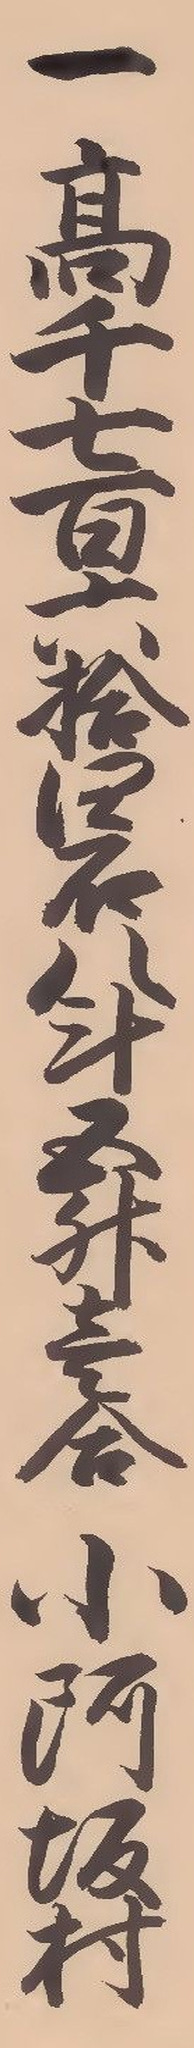一高千七百六拾四石八斗五升壱合小阿坂村
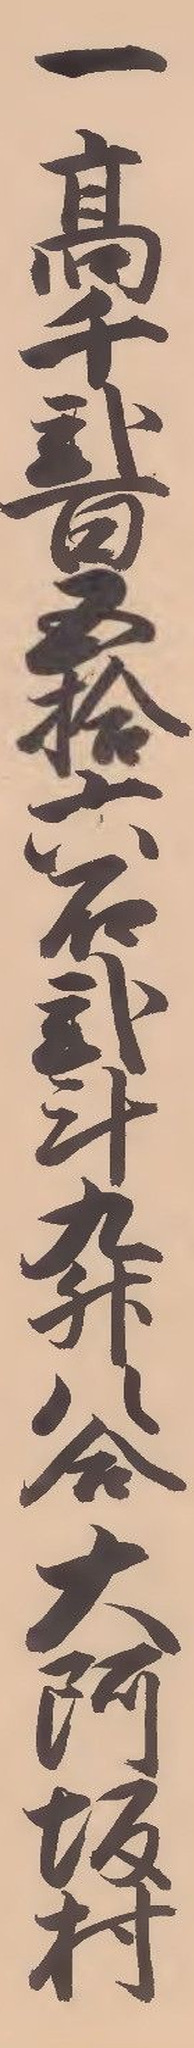一高千弐百五拾六石弐斗九升八合大阿坂村
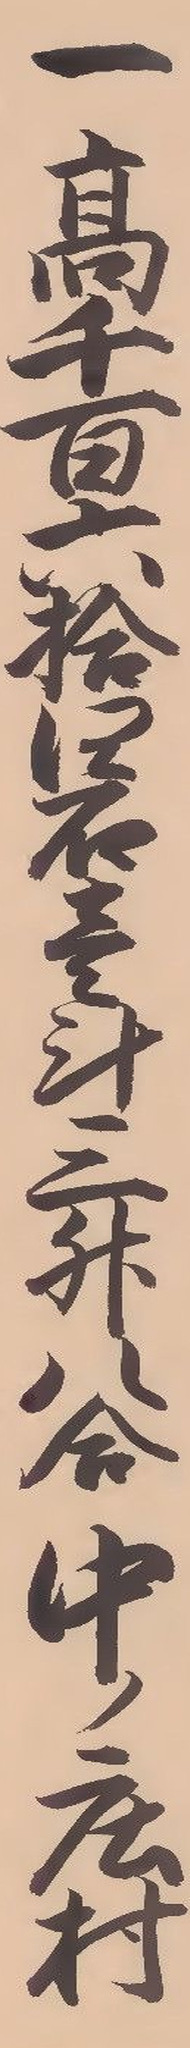一高千百六拾四石壱斗三升八合中ノ庄村
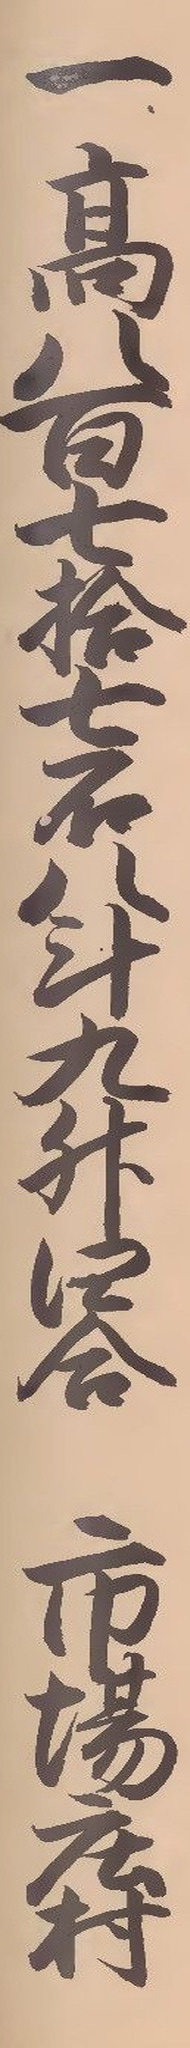一高八百七拾七石八斗九升四合市場庄村
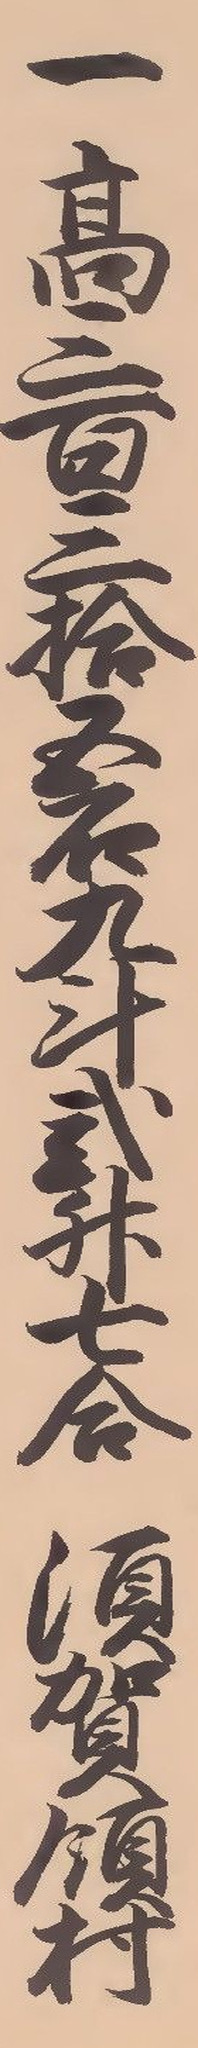一高三百三拾五石九斗弐升七合須賀領村
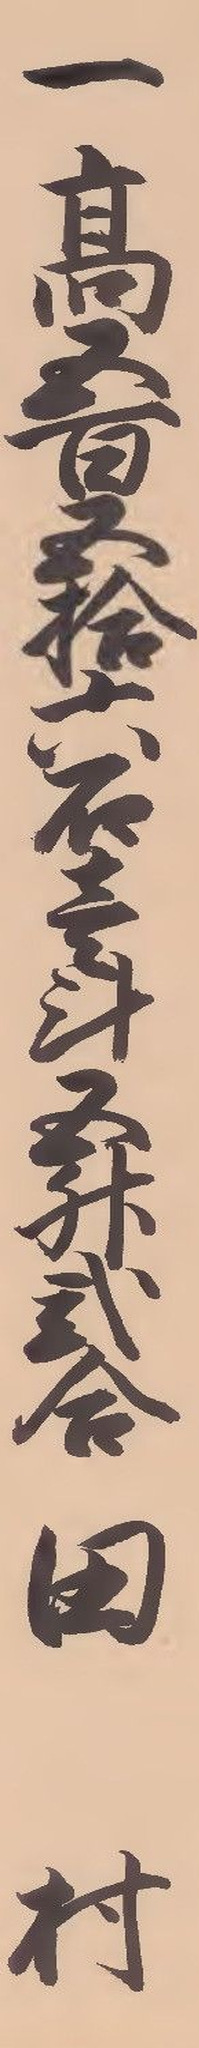一高五百五拾六石壱斗五升弐合田村
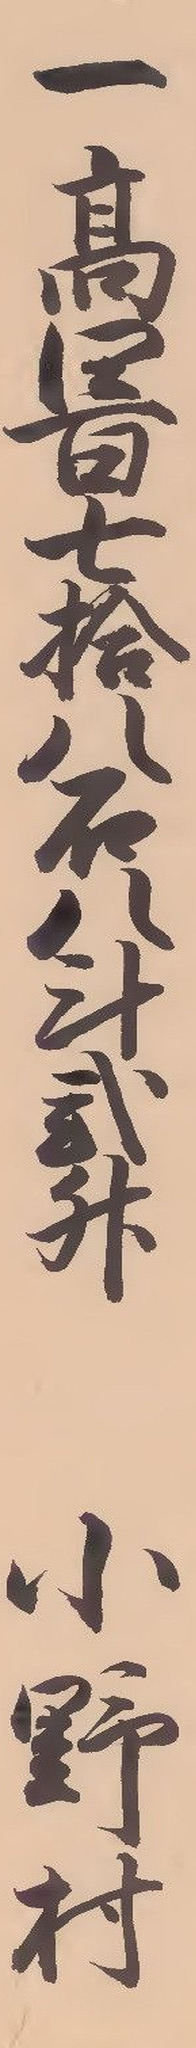一高四百七拾八石八斗弐升小野村

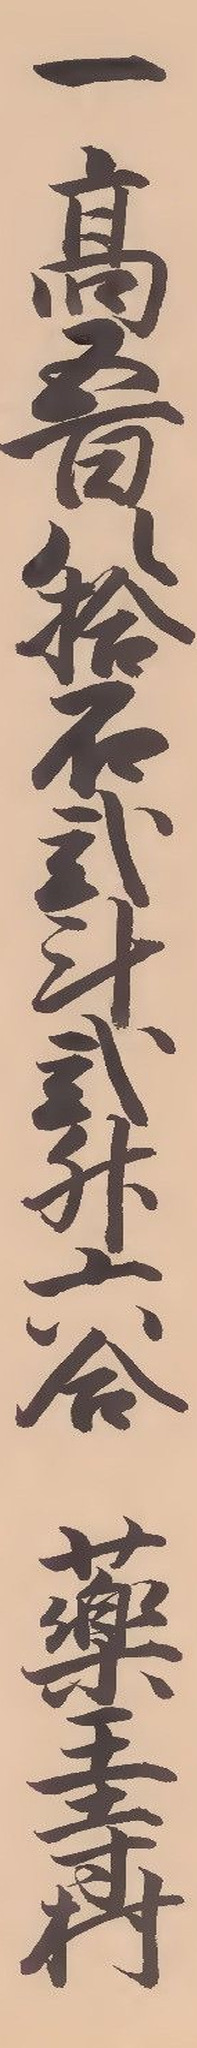一高五百八拾石弐斗弐升六合薬王寺村
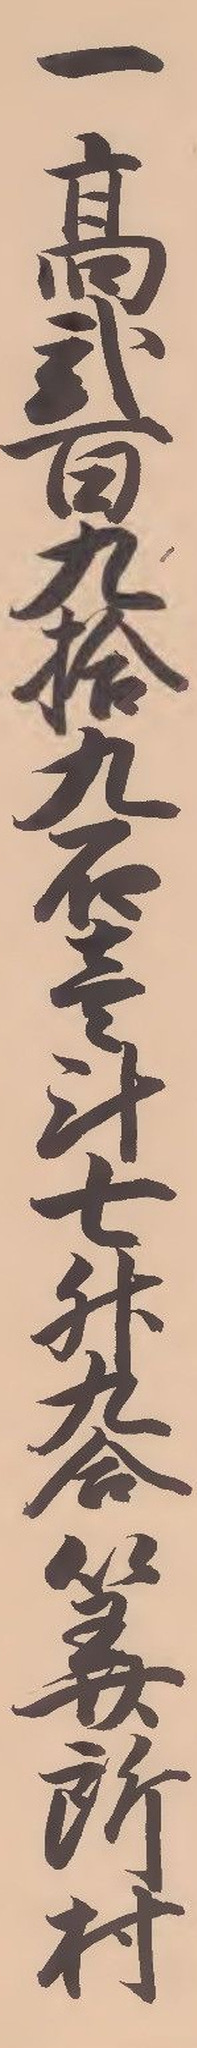一高弐百九拾九石壱斗七升九合算所村
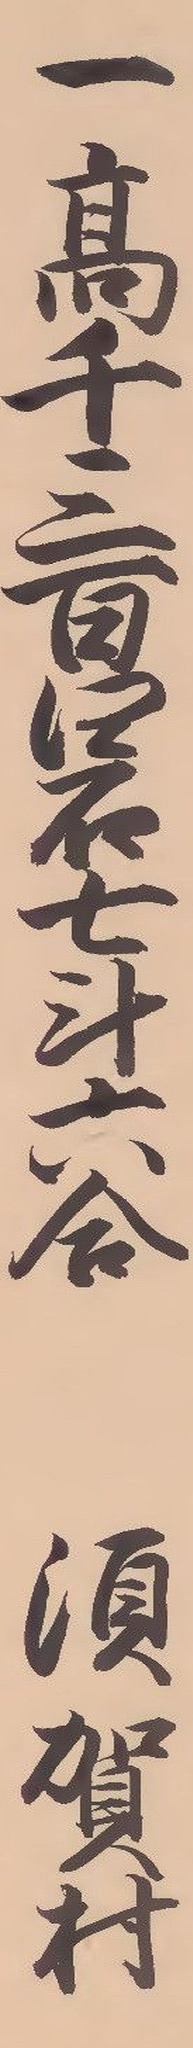一高千三百四石七斗六合須賀村
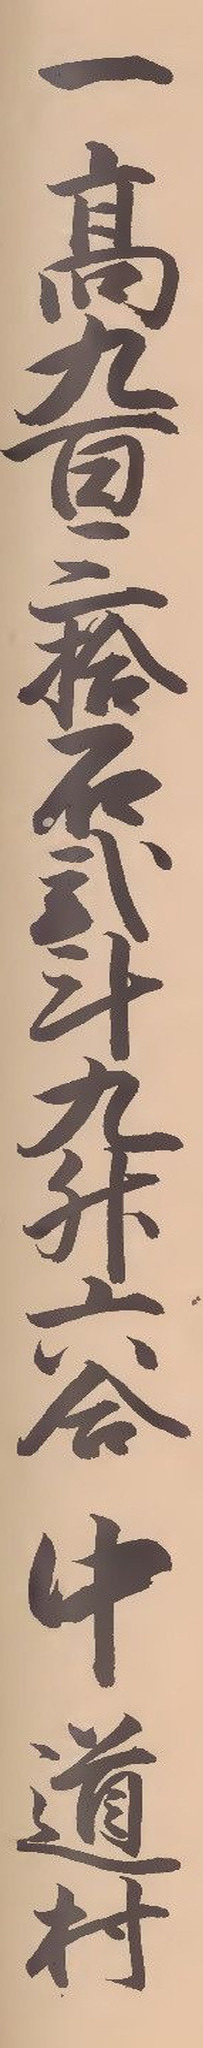一高九百三拾石弐斗九升六合中道村
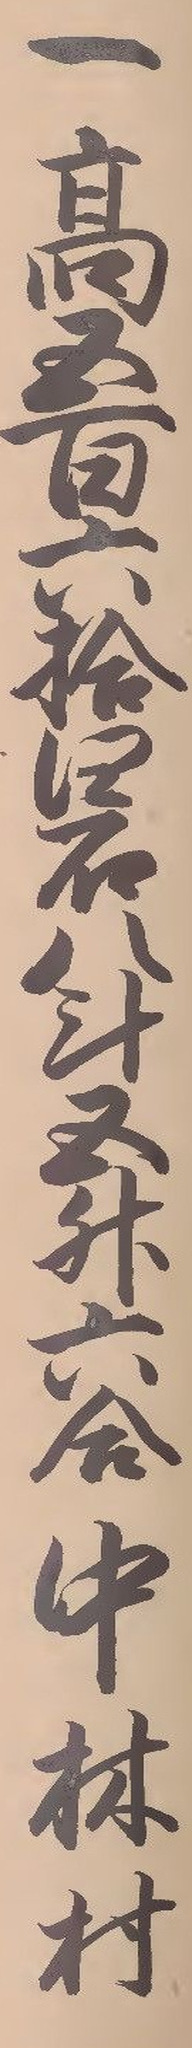一高五百六拾四石八斗五升六合中林村
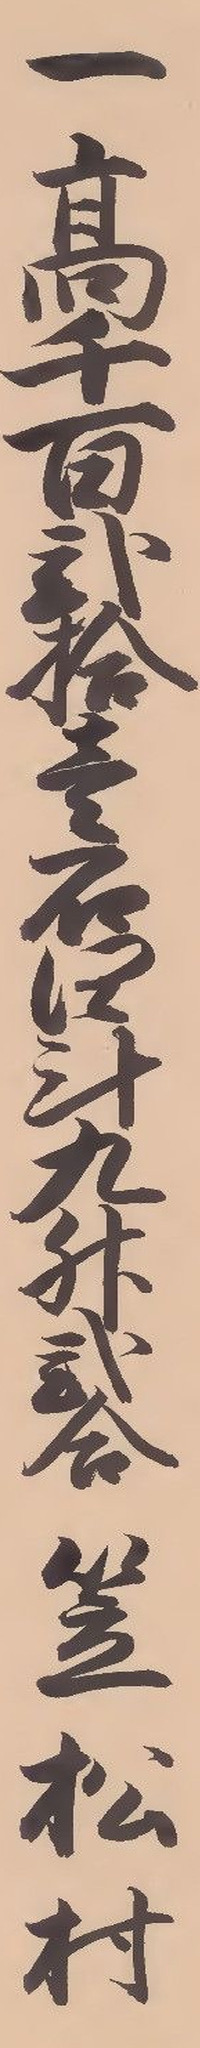一高千百弐拾壱石四斗九升弐合笠松村
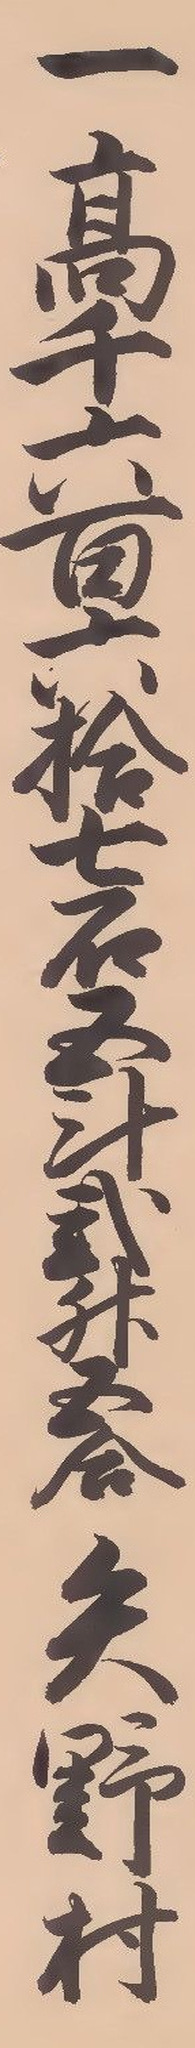一高千六百六拾七石五斗弐升五合矢野村
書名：伊勢国郷帳
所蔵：国立公文書館 National Archives of Japan
